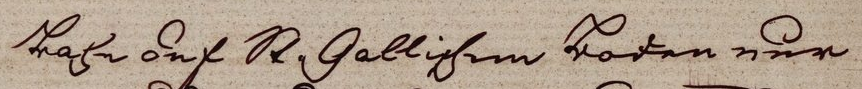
Bahn auf St. Gallischem Boden nur
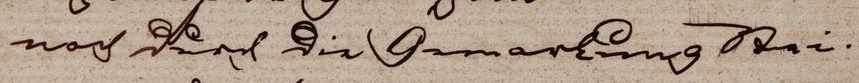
noch durch die Gemarkung Stei-
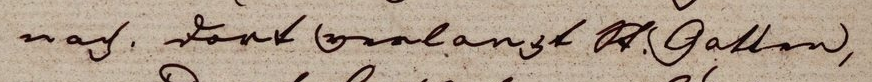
nach. Dort verlangt St. Gallen,
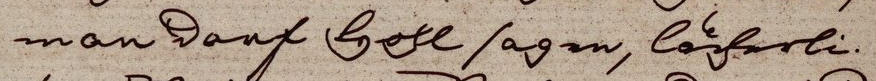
man darf wohl sagen, lächerli-
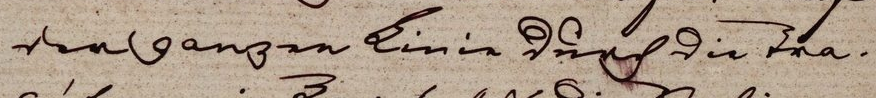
der ganzen Linie durch die Tra-
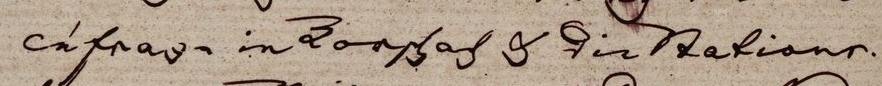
céfrage in Rorschach & die Stations-
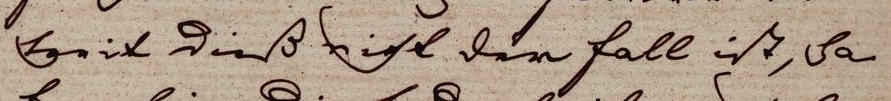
weit dieß nicht der Fall ist, ha-
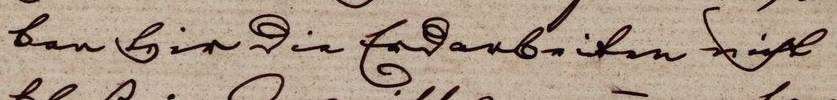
ben wir die Erdarbeiten nicht
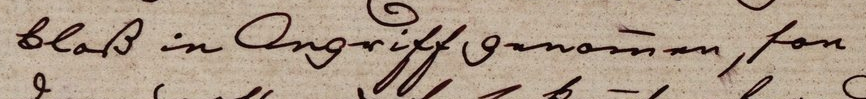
bloß in Angriff genommen, son-
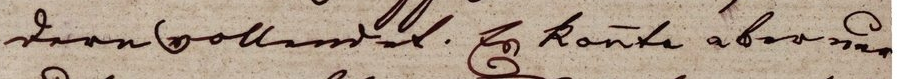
dern vollendet. Es konnte aber nur
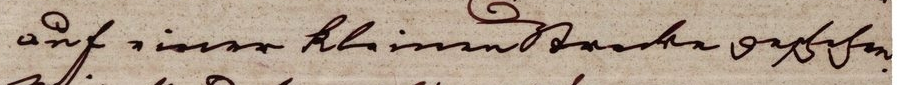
auf einer kleinen Strecke geschehen.
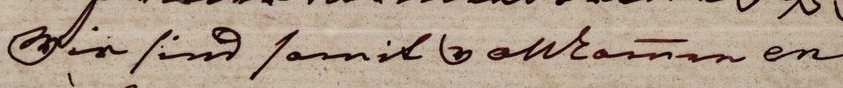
Wir sind somit vollkommen en
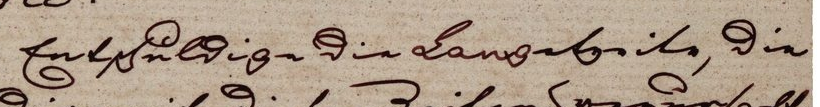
Entschuldige die Langeweile, die
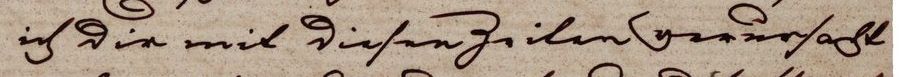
ich Dir mit diesen Zeilen verursacht
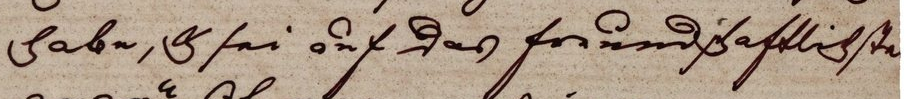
habe, & sei auf das freundschaftlichste
